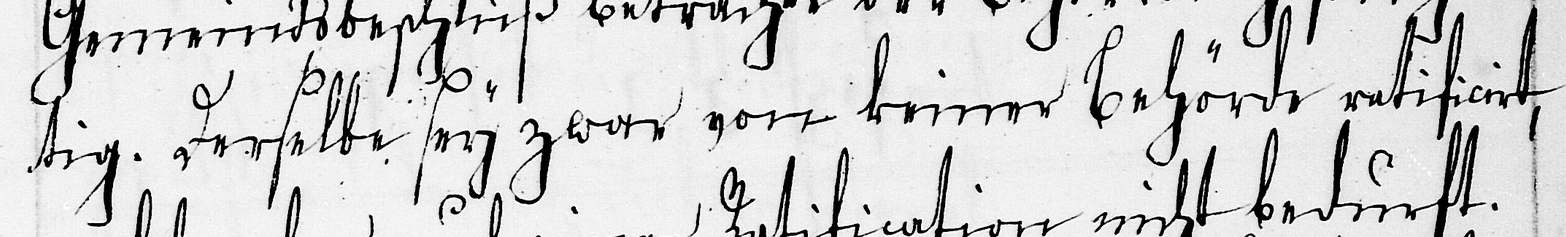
tig. Derselbe sey zwar von keiner Behörde ratificir¬
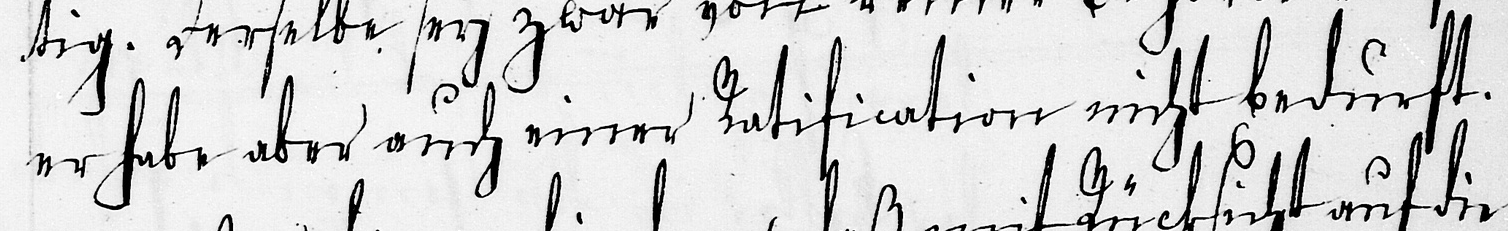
er habe aber auch einer Ratification nicht bedurft.
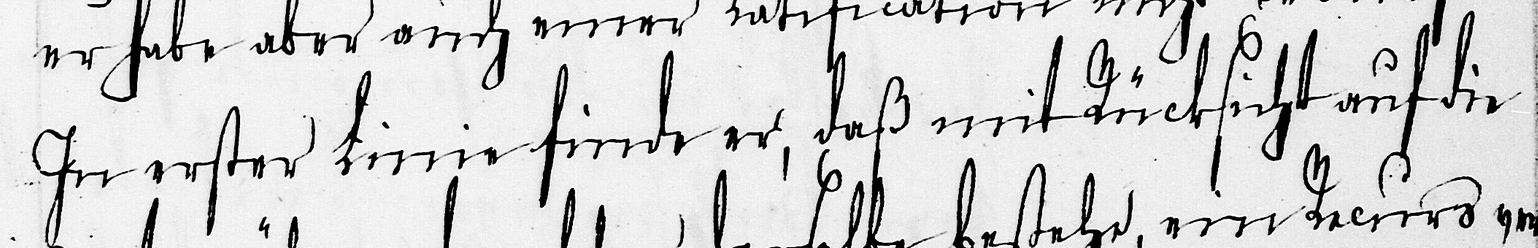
In erster Linie finde er, daß mit Rücksicht auf die
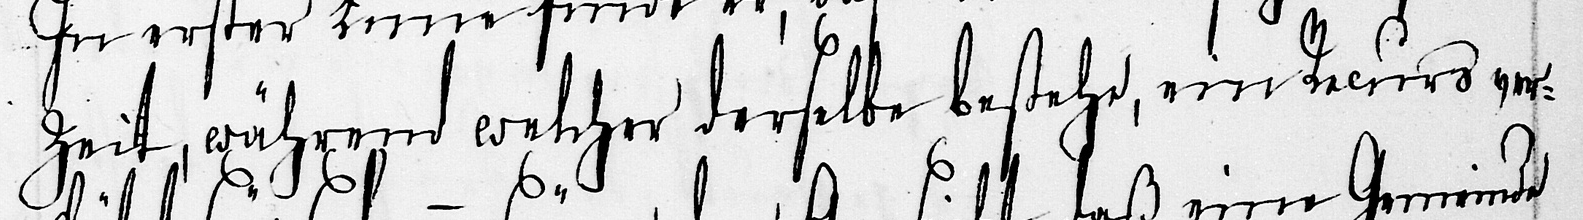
Zeit, während welcher derselbe bestehe, ein Recurs ver¬
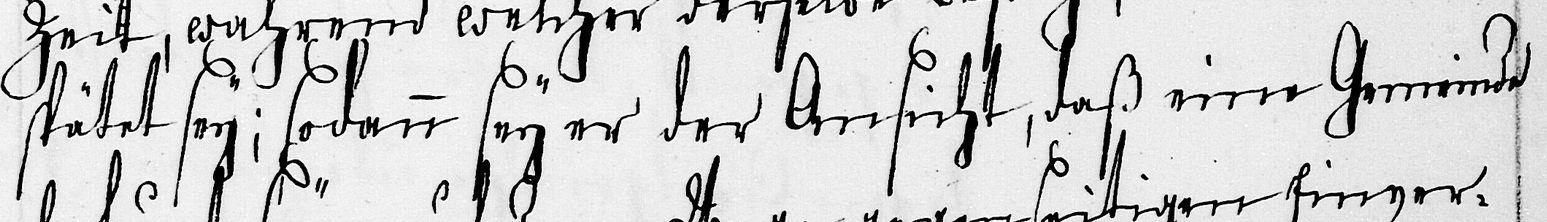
spätet sey; sodann sey er der Ansicht, daß eine Gemeinde
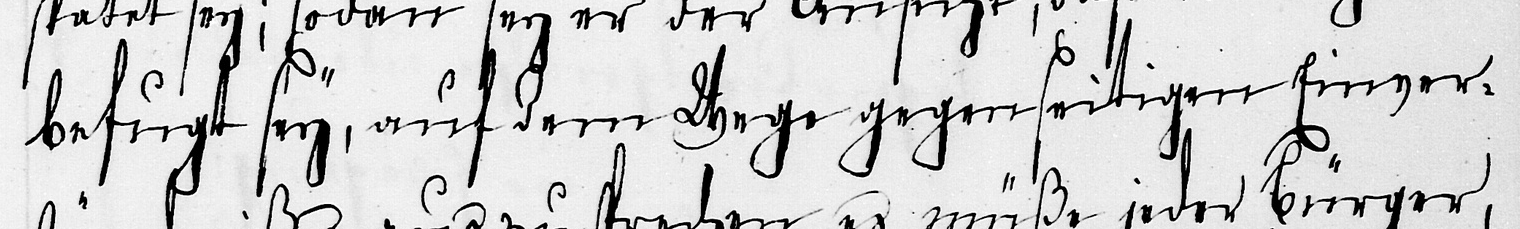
befugt sey, auf dem Wege gegenseitigen Einver¬
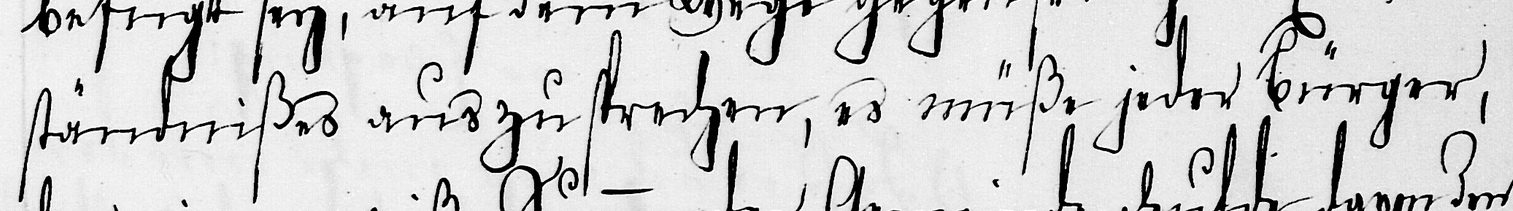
ständnißes auszusprechen, es müße jeder Bürger,
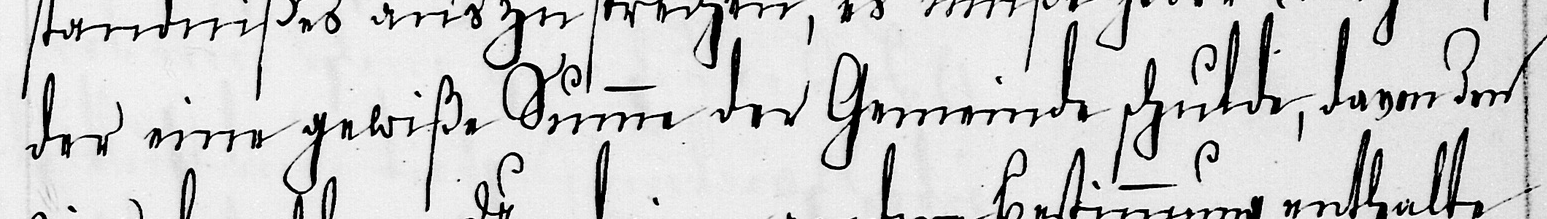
der eine gewiße Summe der Gemeinde schulde, davon den
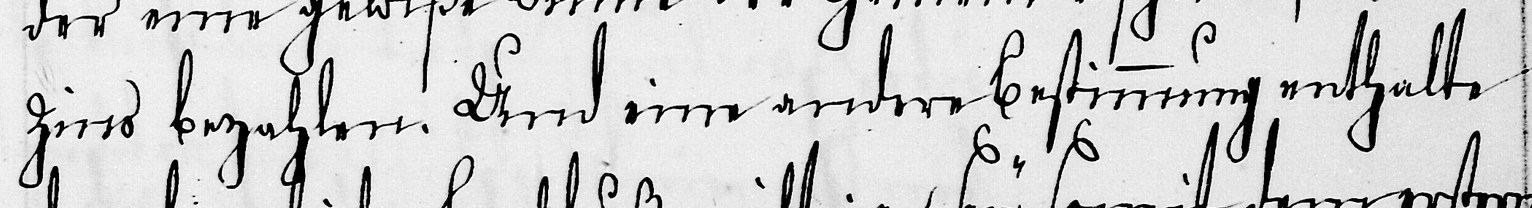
Zins bezahlen. Und eine andere Bestimmung enthalte
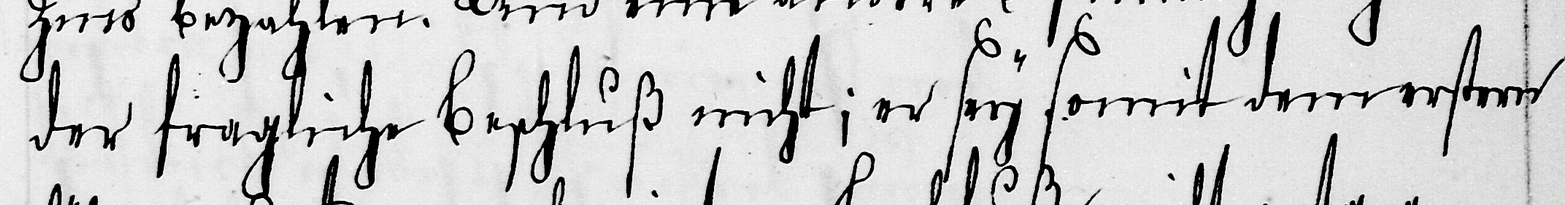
der fragliche Beschluß nicht; er sey somit dem erstern
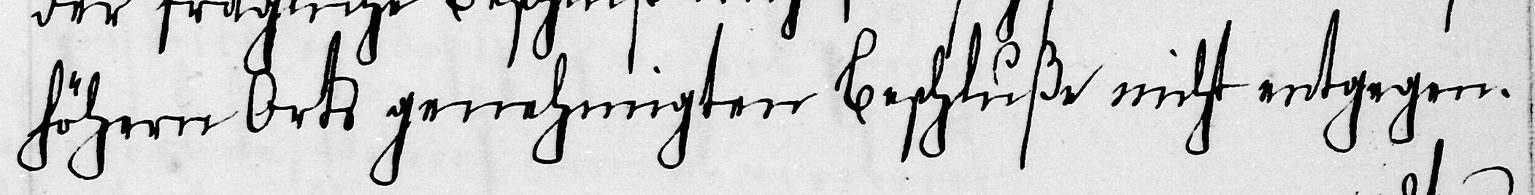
höhern Orts genehmigten Beschluße nicht entgegen.
